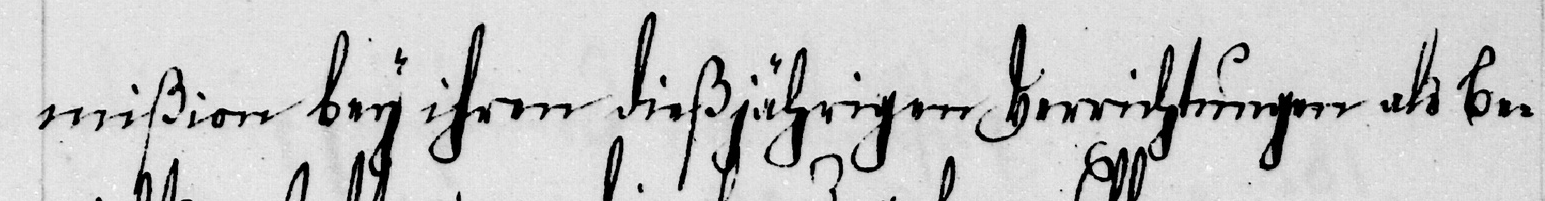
mißion bey ihren dießjährigen Verrichtungen als Be¬
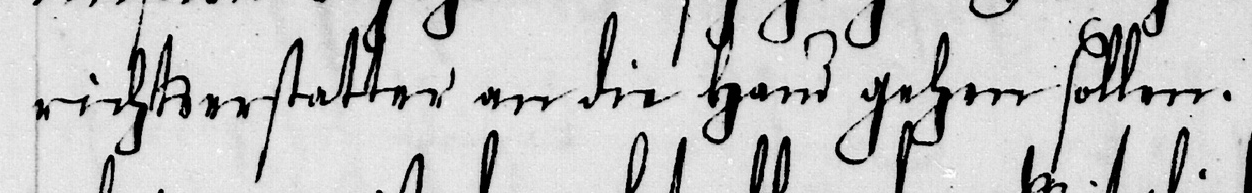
richtserstatter an die Hand gehen sollen.
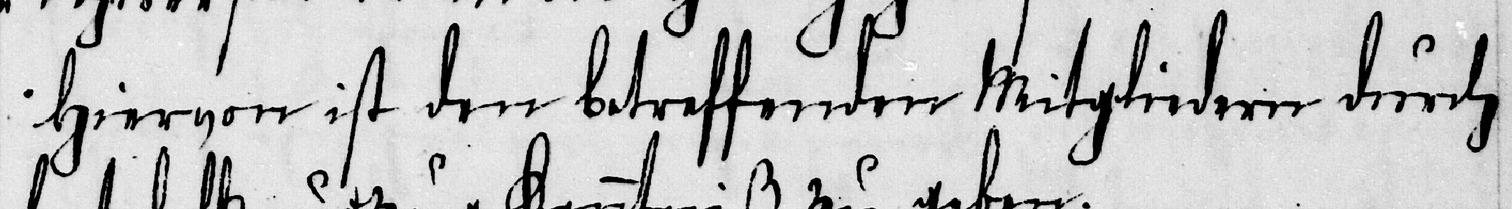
Hiervon ist den betreffenden Mitgliedern durch
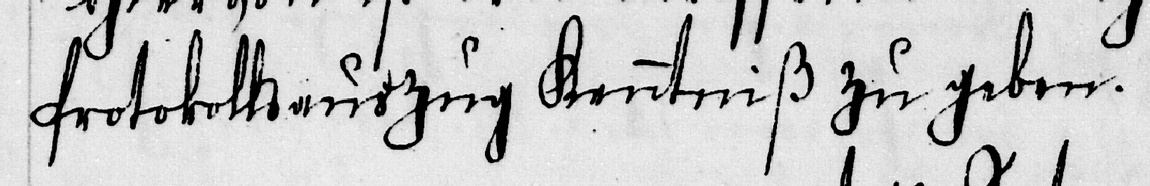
Protokollsauszug Kenntniß zu geben.
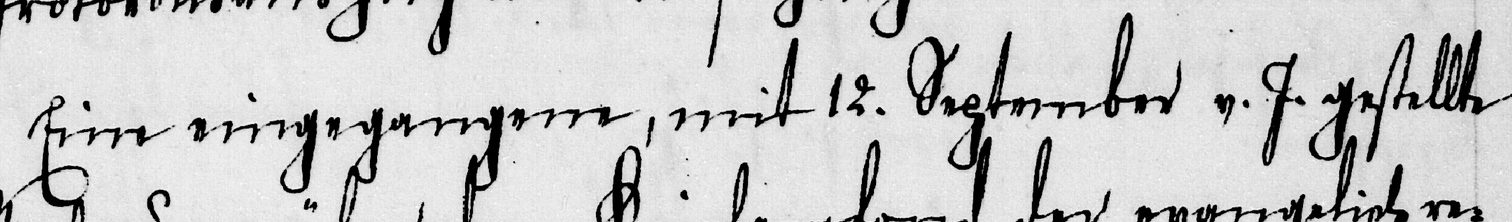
Eine eingegangene, mit 12. September v. J. gestellte
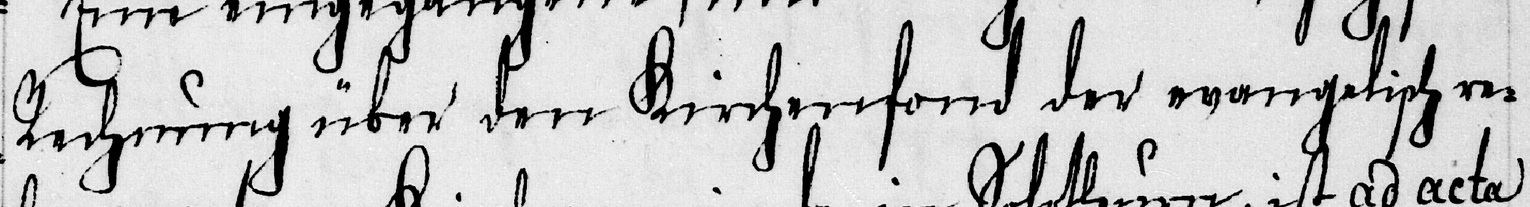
Rechnung über den Kirchenfond der evangelisch re¬
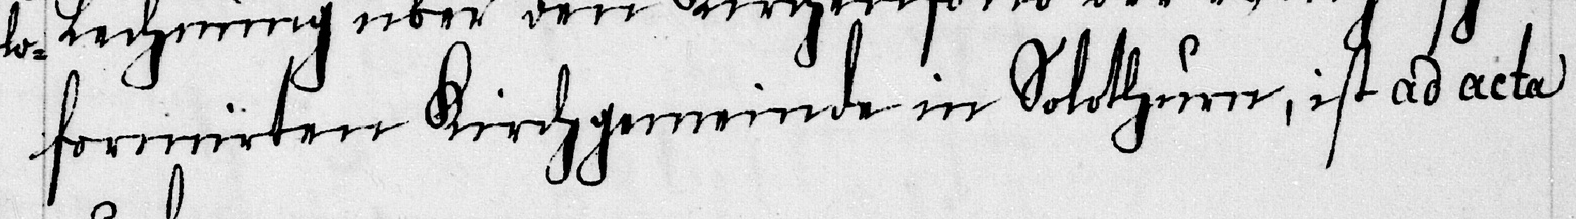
formirten Kirchgemeinde in Solothurn, ist ad acta
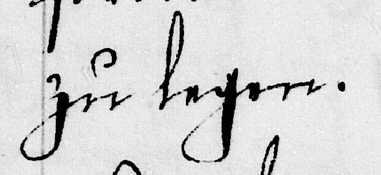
zu legen.
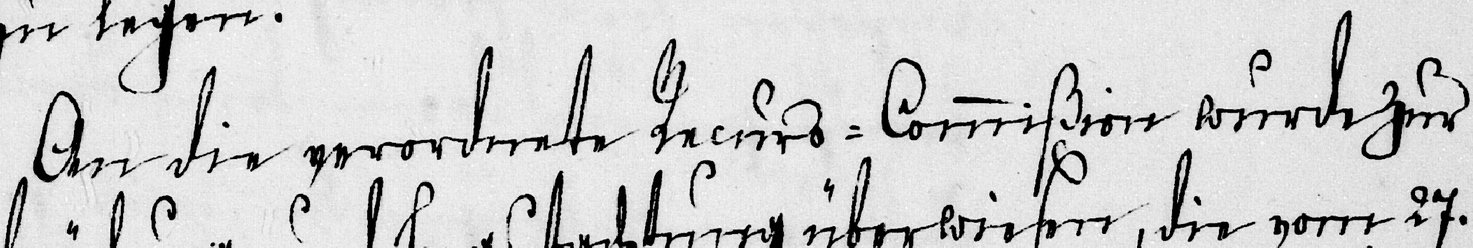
An die verordnete Recurs-Commißion wurde zur
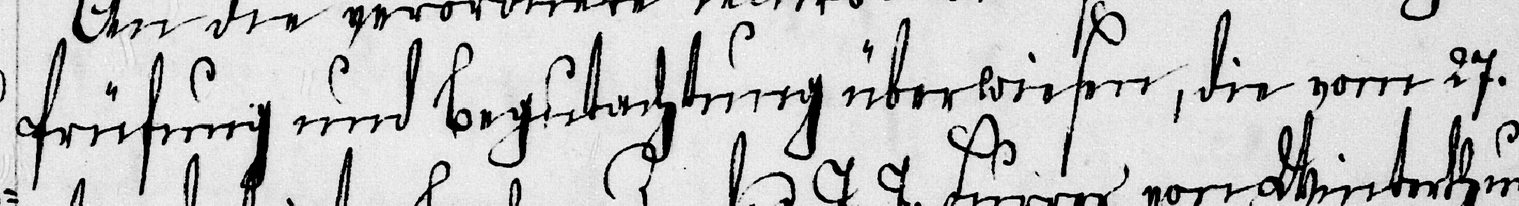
Prüfung und Begutachtung überwiesen, die vom 27.
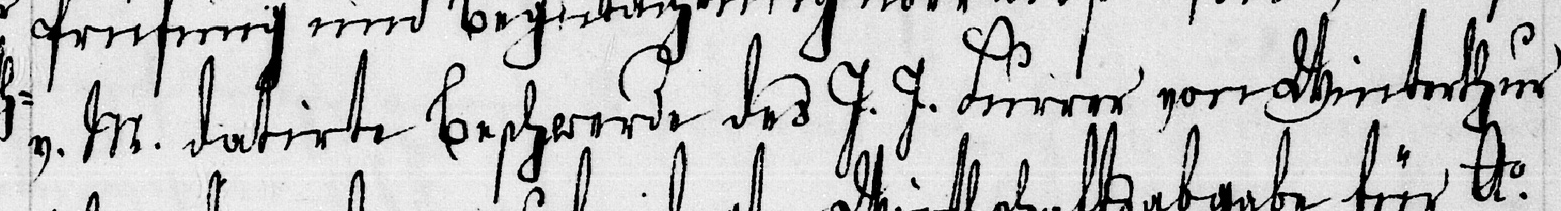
v. M. datirte Beschwerde des J. J. Furrer von Winterthur
